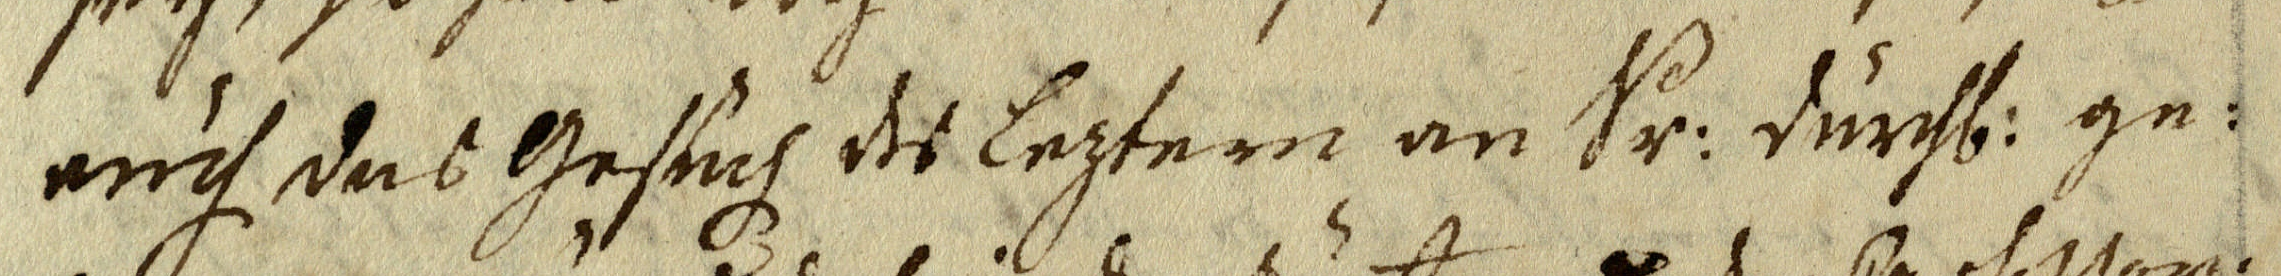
auch das Gesuch des leztern an Sr Durchl. ge¬
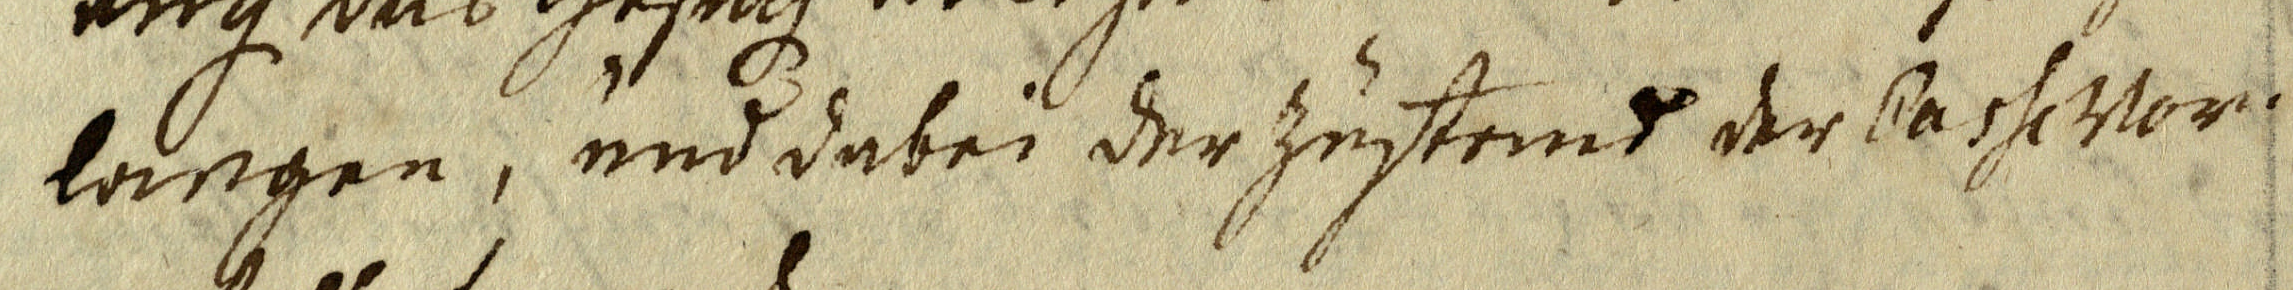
langen, und dabei der Zustand der Casse vor¬
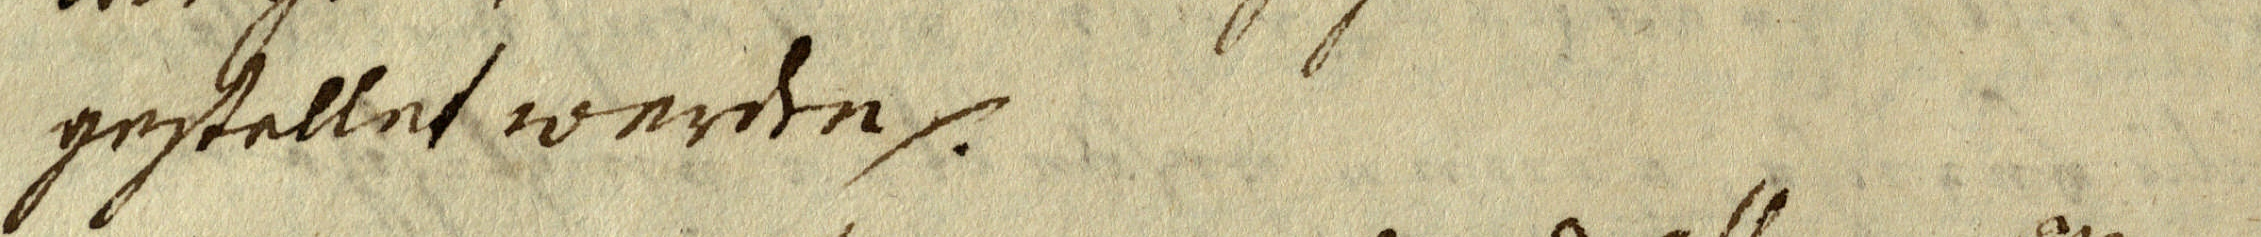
gestellet werden.
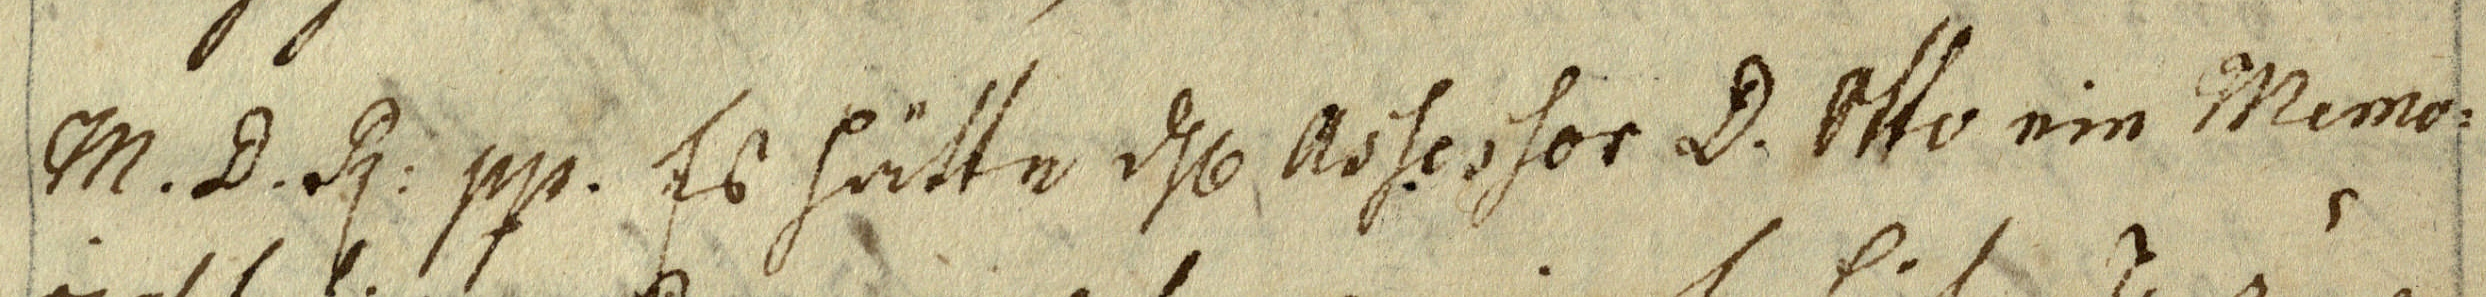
10. M. D. R. pp. Es hätte dh Assessor D. Otto ein Memo¬
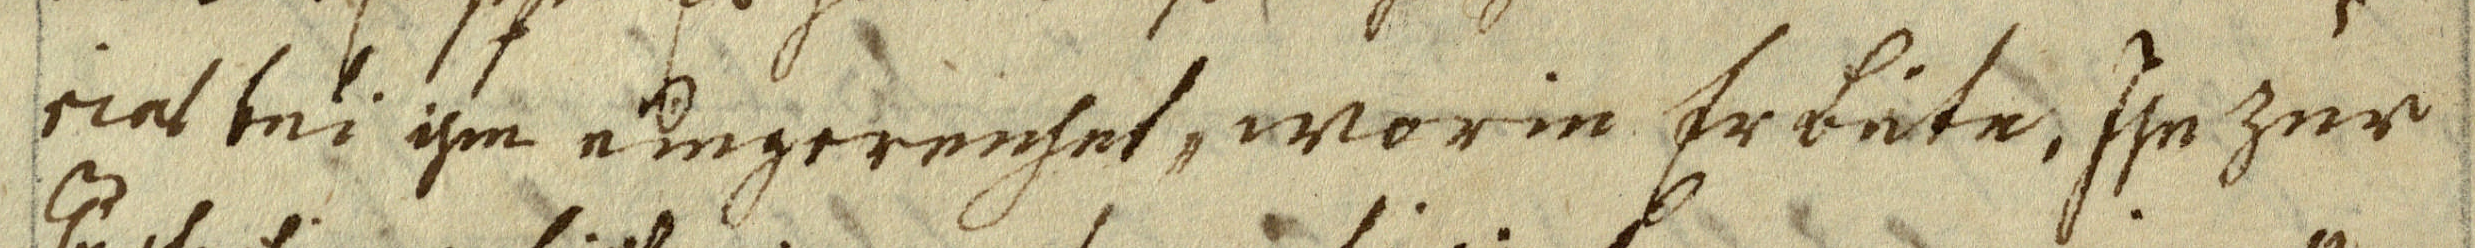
ria bei ihm eingereichet, worin Er bäte, Ihn zur
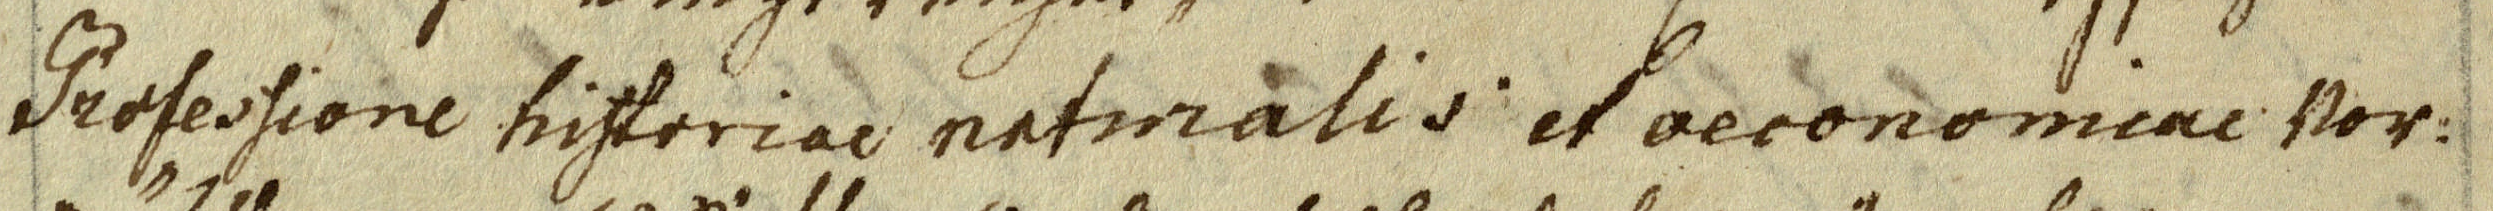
Professione historiae naturalis et oeconomiae vor¬
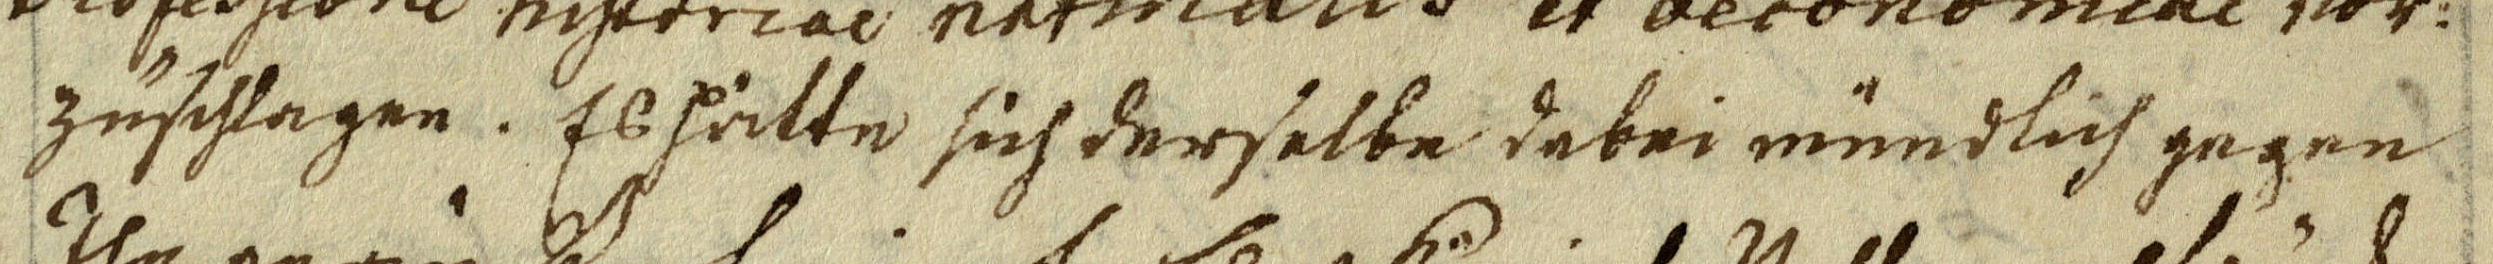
zuschlagen. Es hätte sich derselbe dabei mündlich gegen
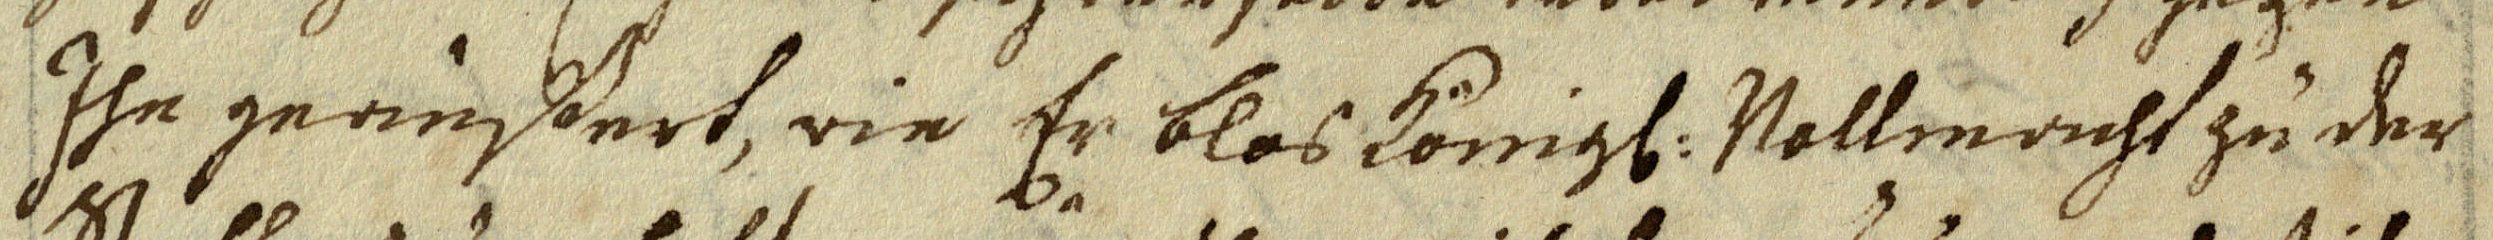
Ihn geäußert, wie Er blos Königl. Vollmacht zu der
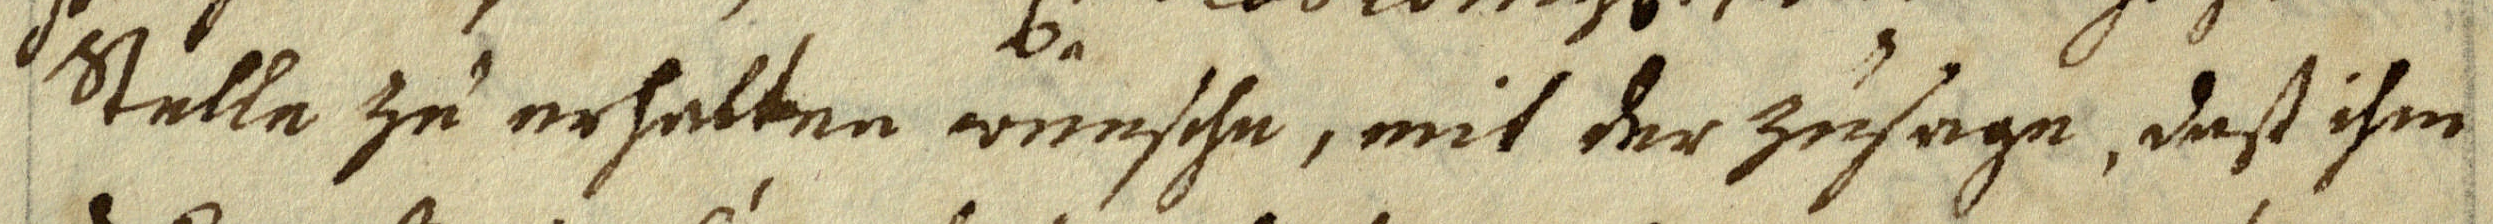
Stelle zu erhalten wünsche, mit der Zusage, daß ihm
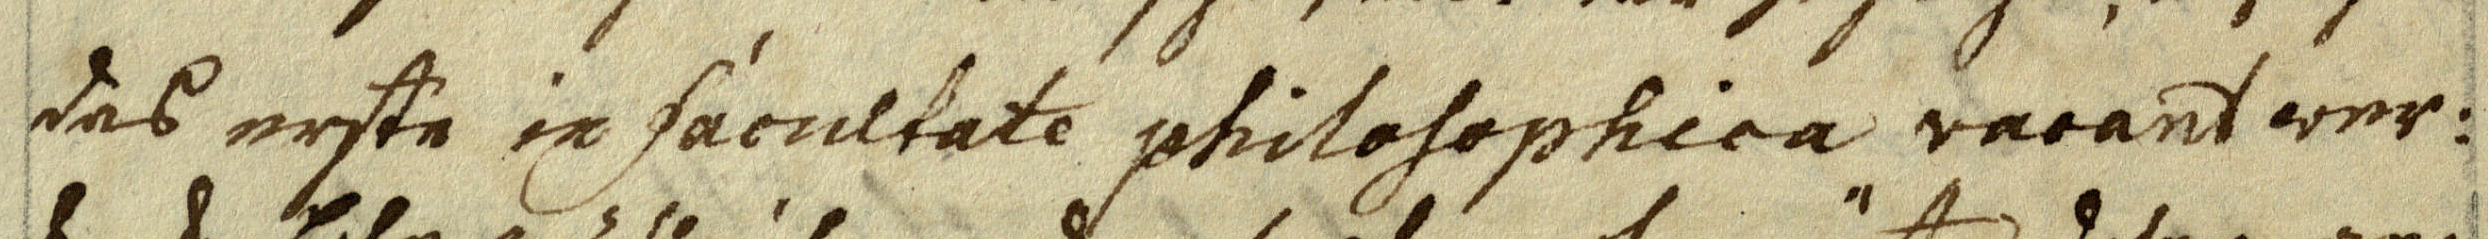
das erste in Facultate philosophica vacant wer¬
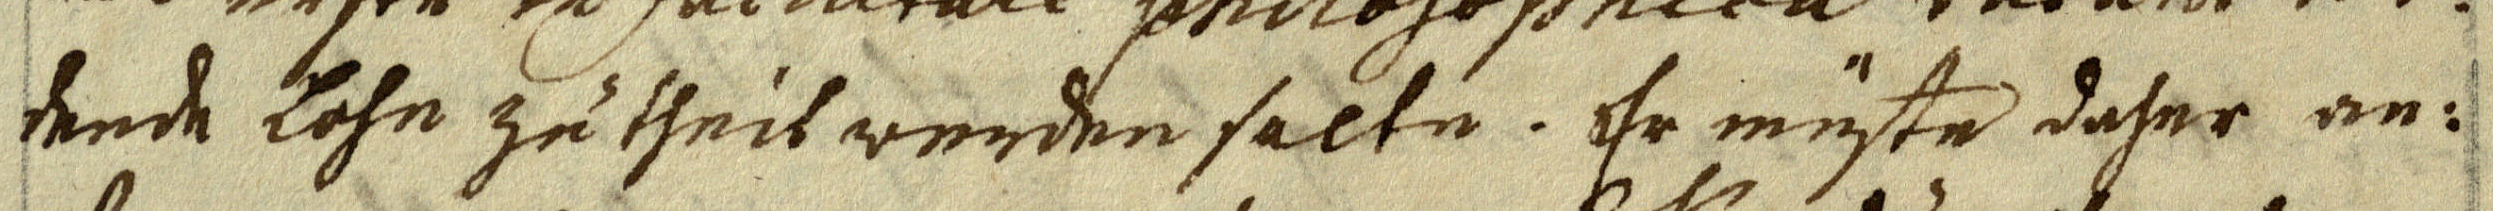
dende Lohn zu theil werden solte. Er müste daher an¬
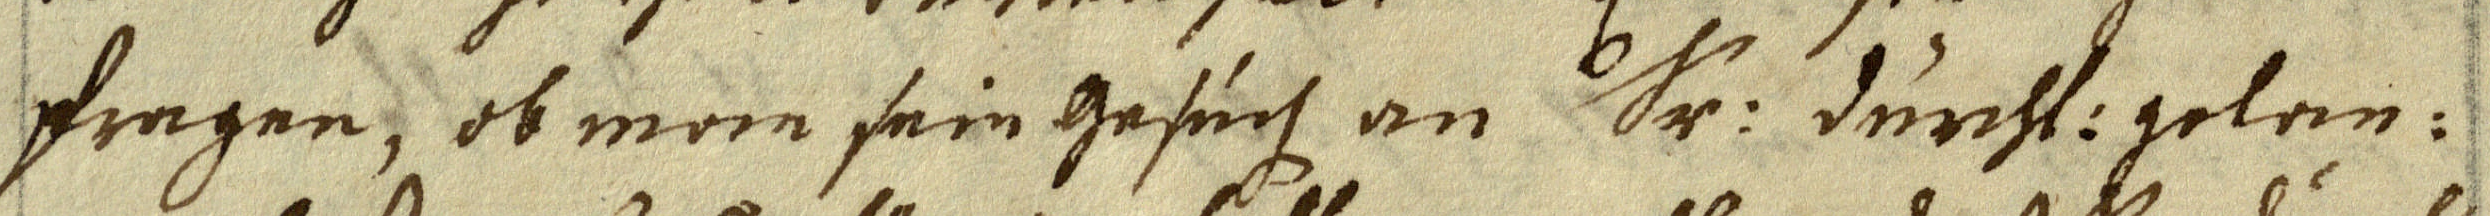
fragen, ob man sein Gesuch an Sr Durchl. gelan¬
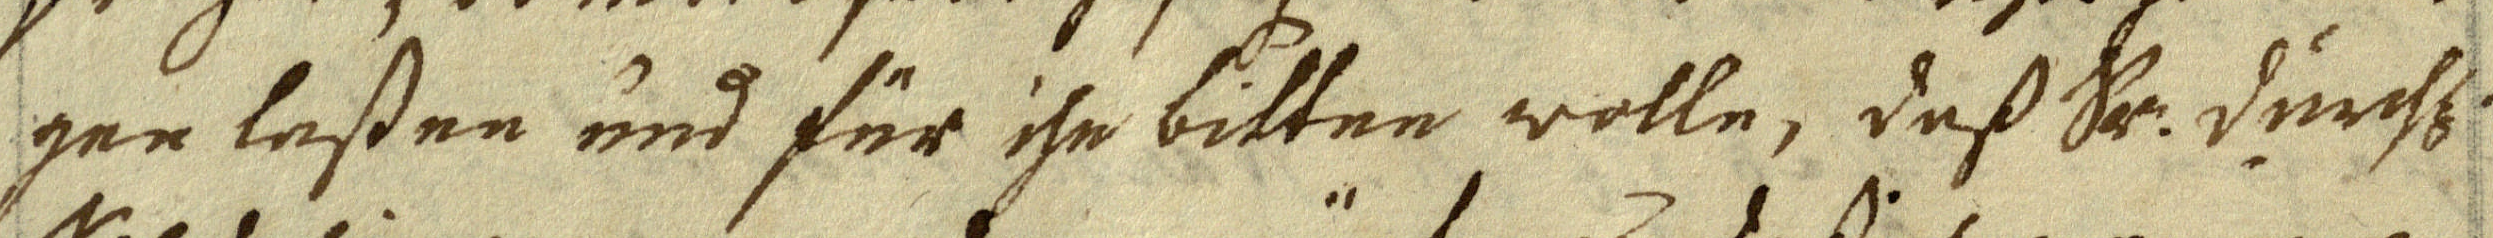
gen laßen und für ihn bitten wolle, daß Sr Durchl.
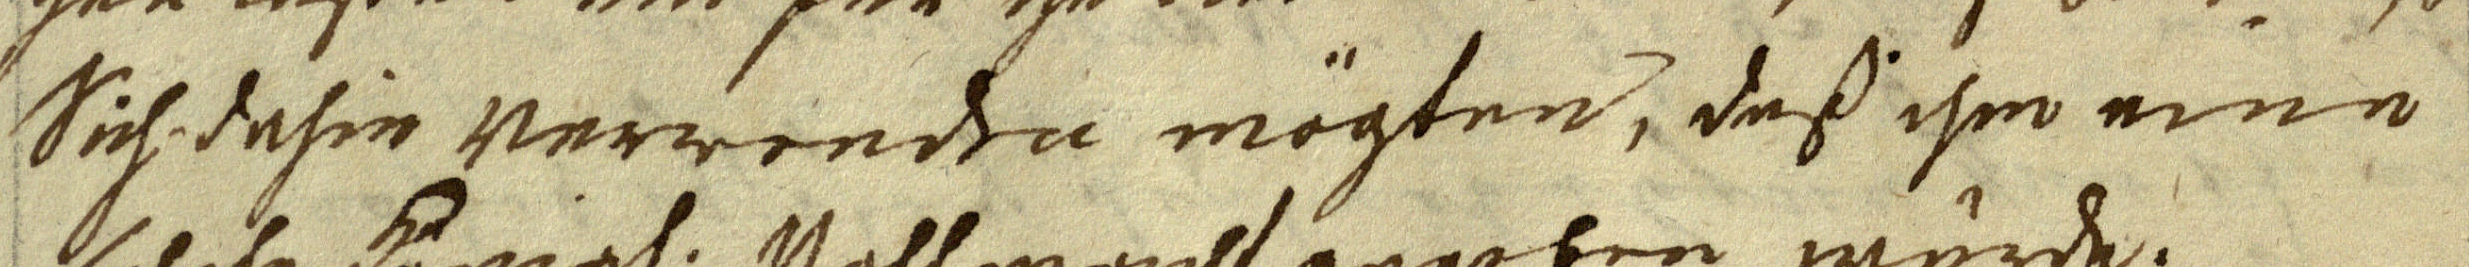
Sich dahin verwenden mögten, daß ihm eine
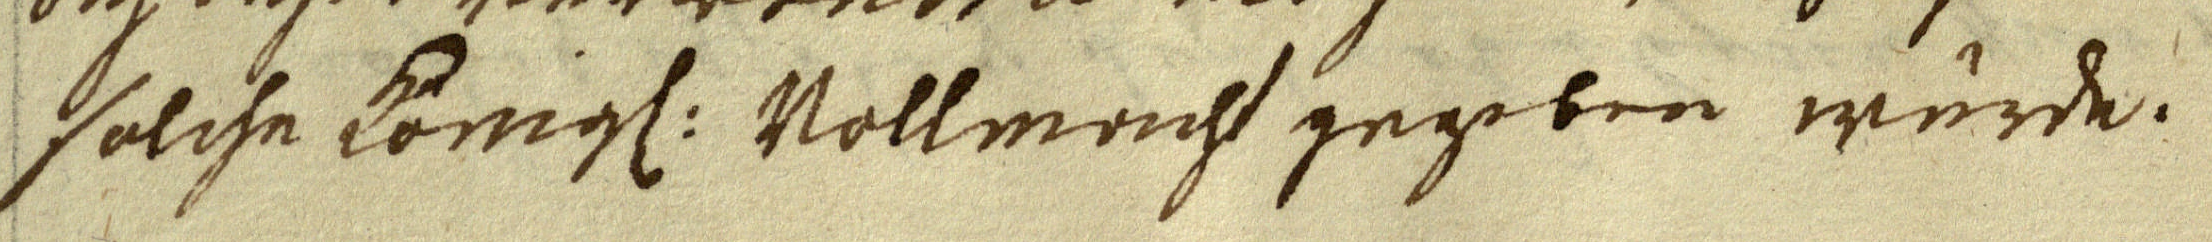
solche Königl. Vollmacht gegeben würde.
